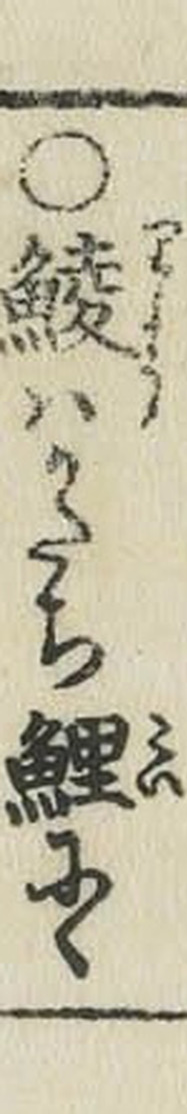○鯪はかたち鯉にゝ
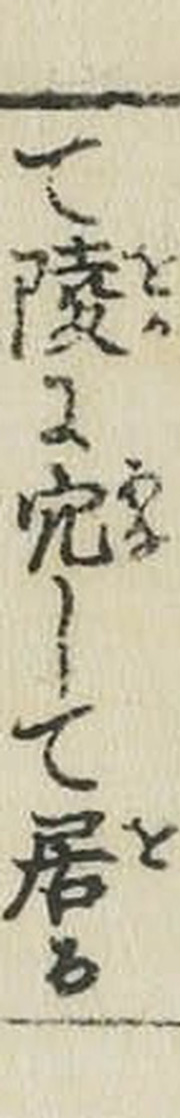て陵に穴して居る
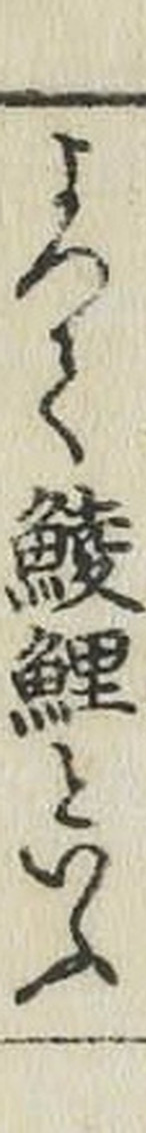よつて鯪鯉といふ
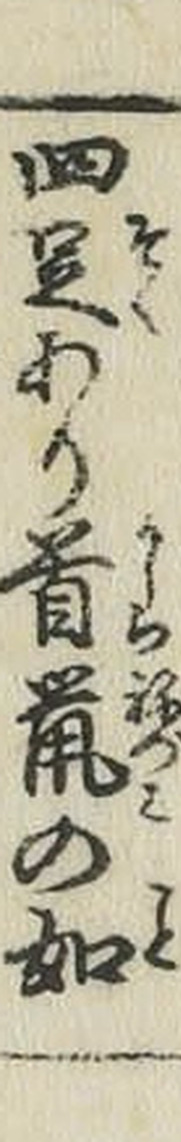四足あり首鼠の如
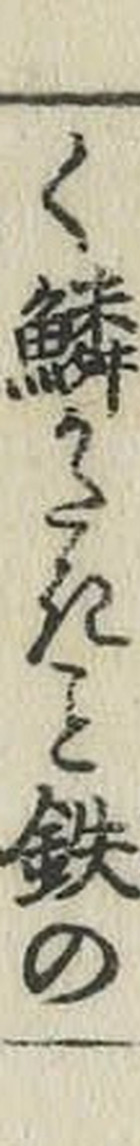く鱗かたきこと鉄の
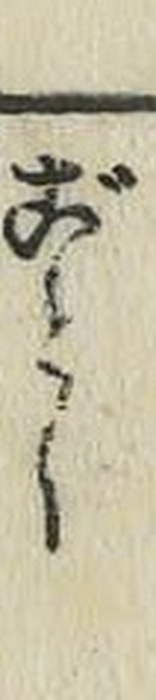ごとし
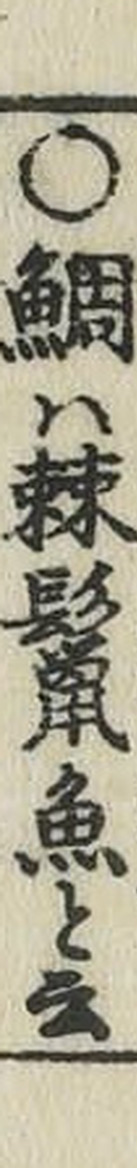○鯛は棘鬣魚と云
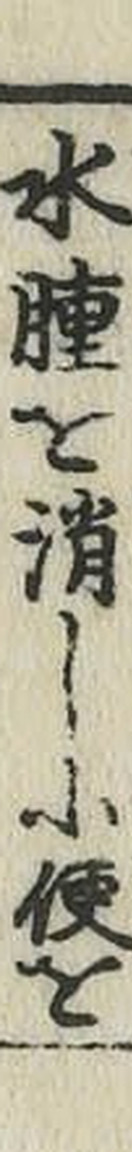水腫を消し小便を
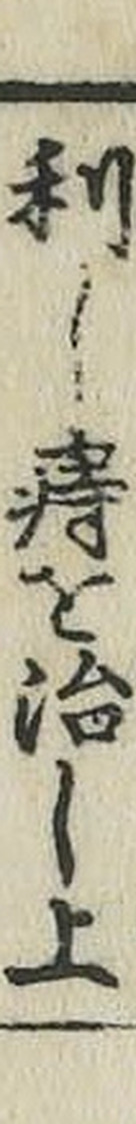利し痔を治し上
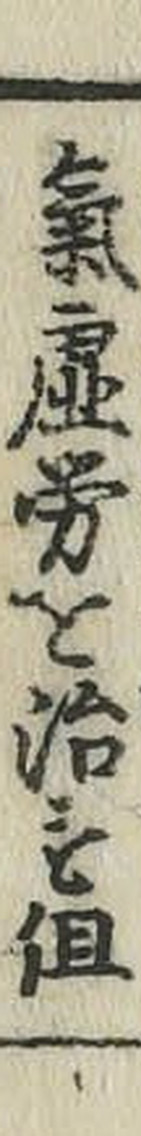気虚労を治す但

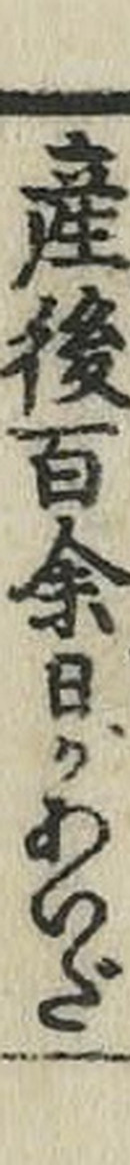産後百余日があいだ
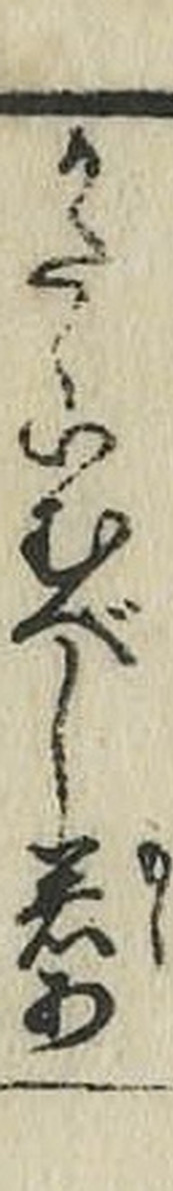かたくいむべし若あ
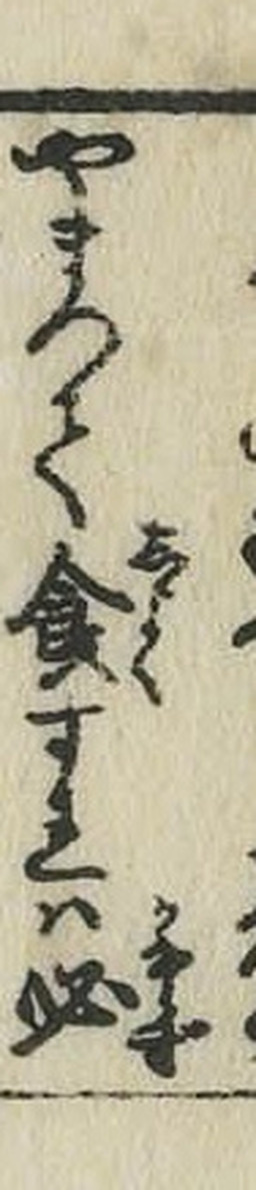やまつて食すれは必
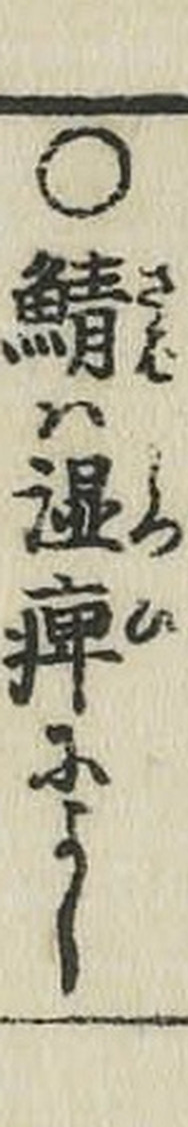○鯖は湿痺によし
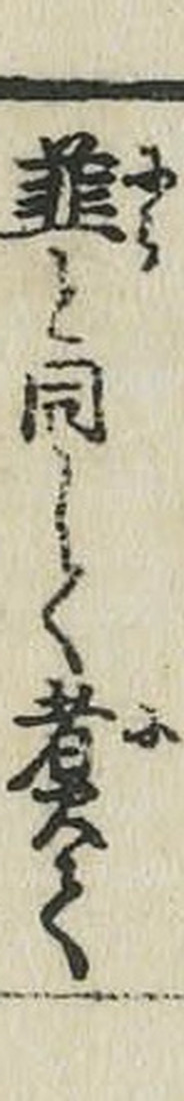韮と同しく煮て
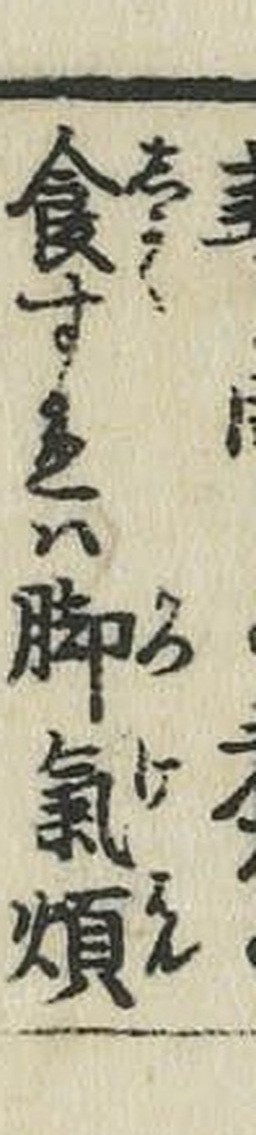食すれは脚気煩
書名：増補頭書訓蒙図彙大成 10巻 7:巻之14-16
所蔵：東京学芸大学教育コンテンツアーカイブ
